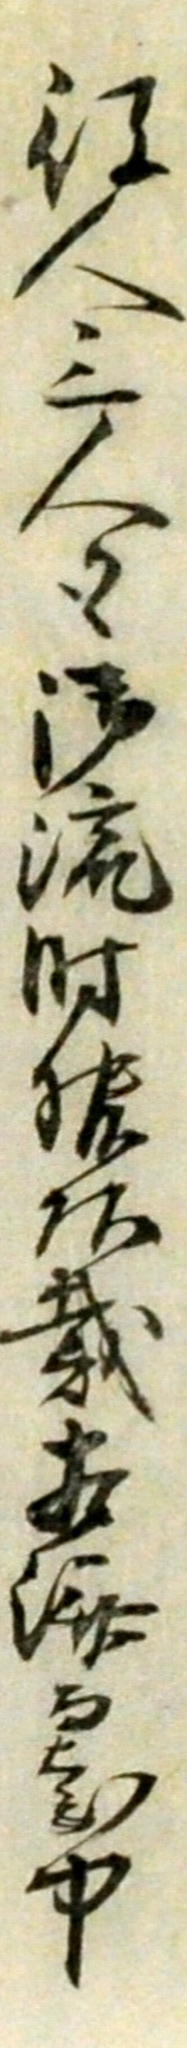役人三人ツヽ御流時服頂戴相済て老中
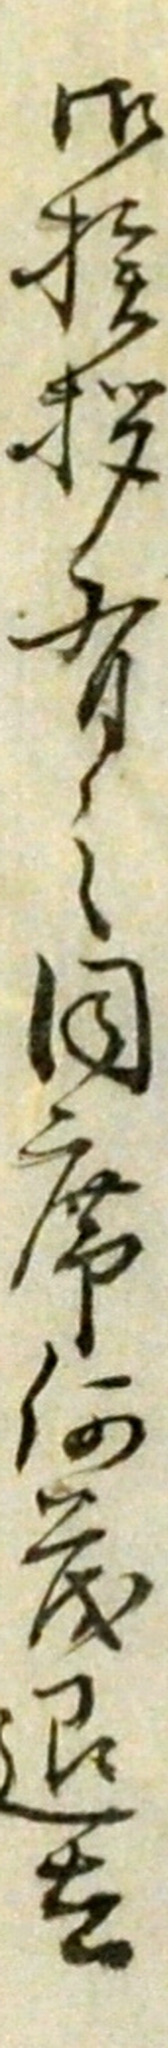御挨拶有之同席何も退去
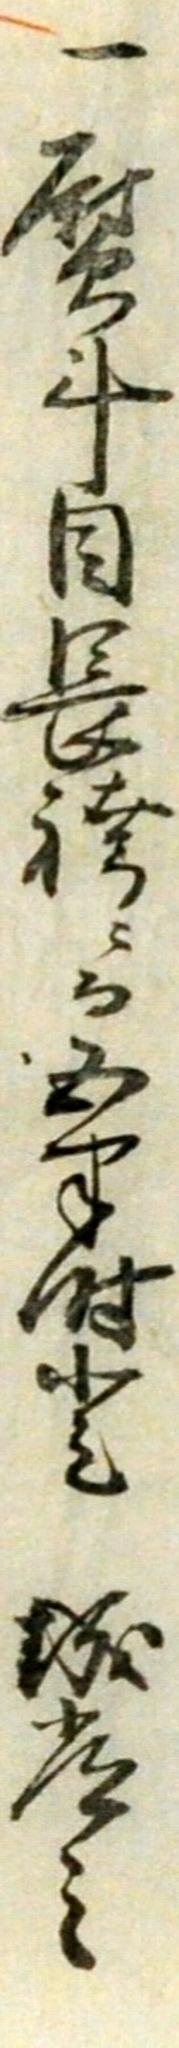一熨斗目長袴にて五半時登城常之
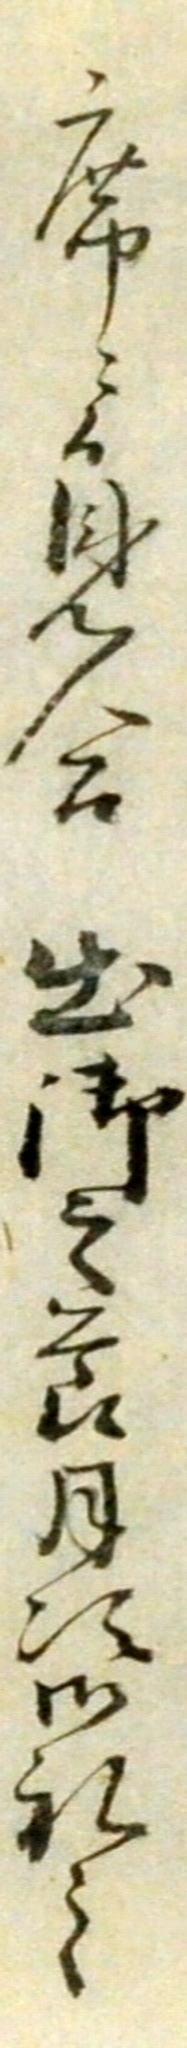席にて見合出御之節月次御礼之
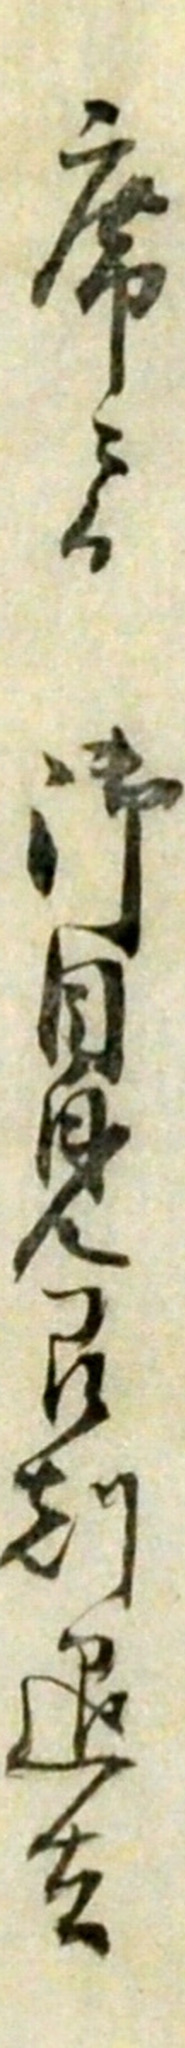席にて御目見即刻退去

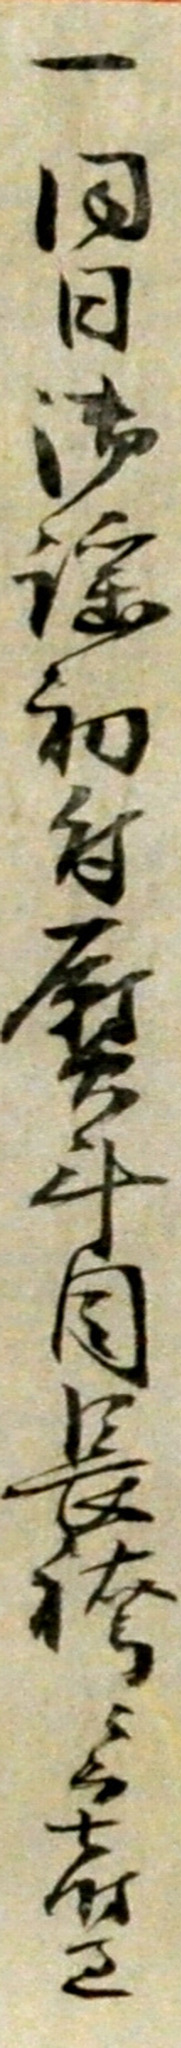一同日御謡初付熨斗目長袴にて七時過
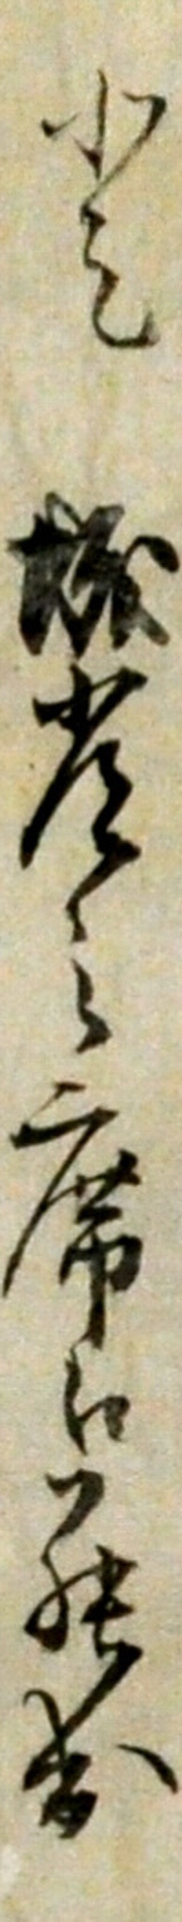登城常之席え罷出
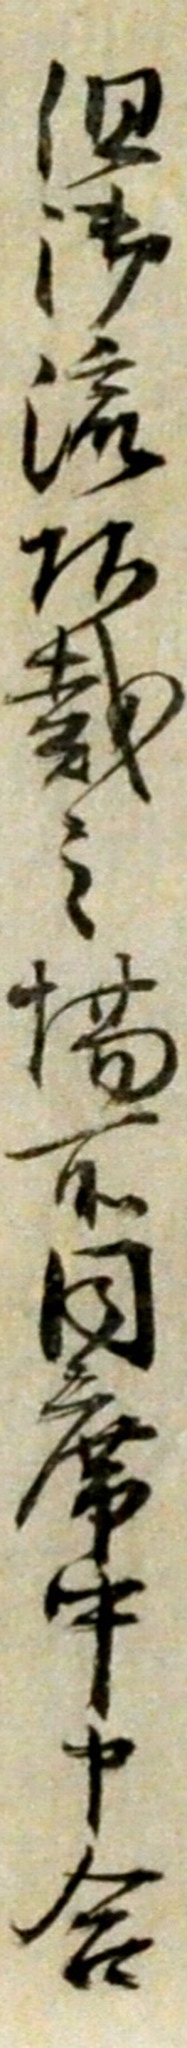但御流頂戴之場所同席中申合
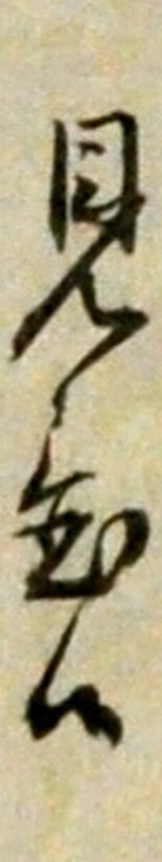見置候
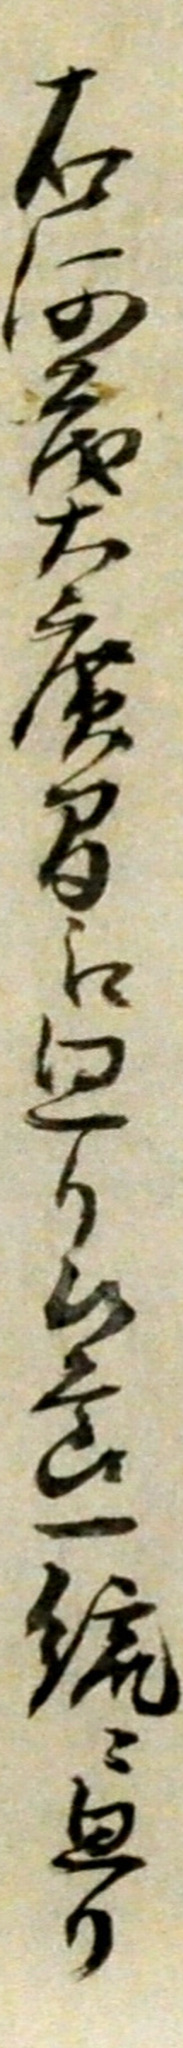右何も大広間え廻り候節一統に廻り
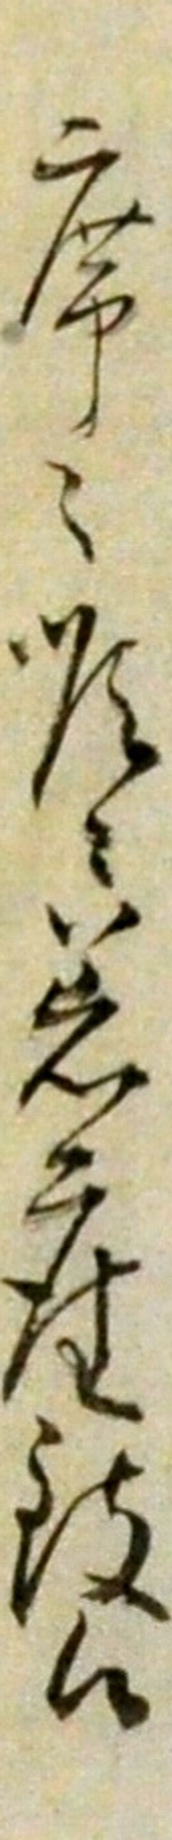席々順々着座致候
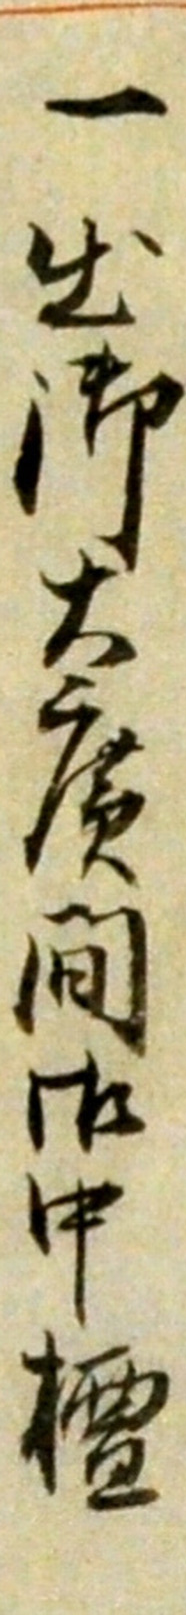一出御大広間御中壇
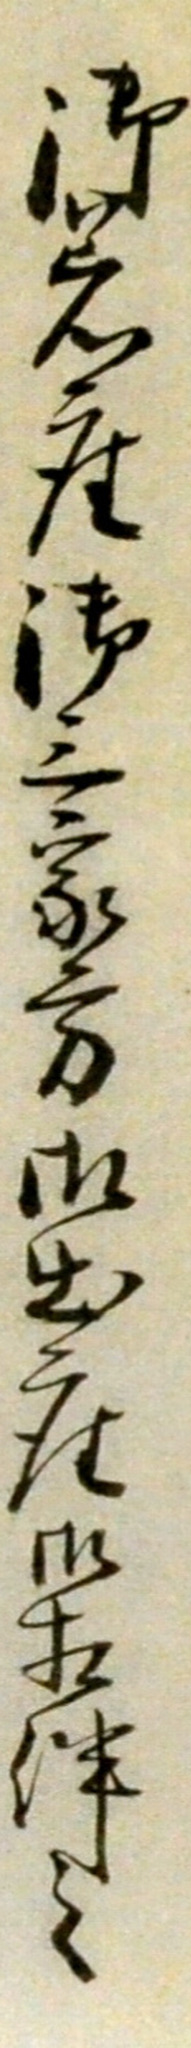御着座御三家方御出座御相伴之
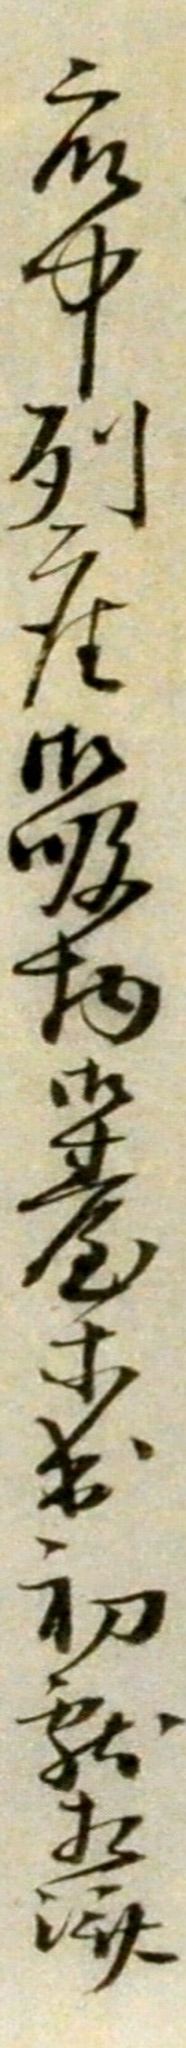衆中列座御吸物御台等出初献相済
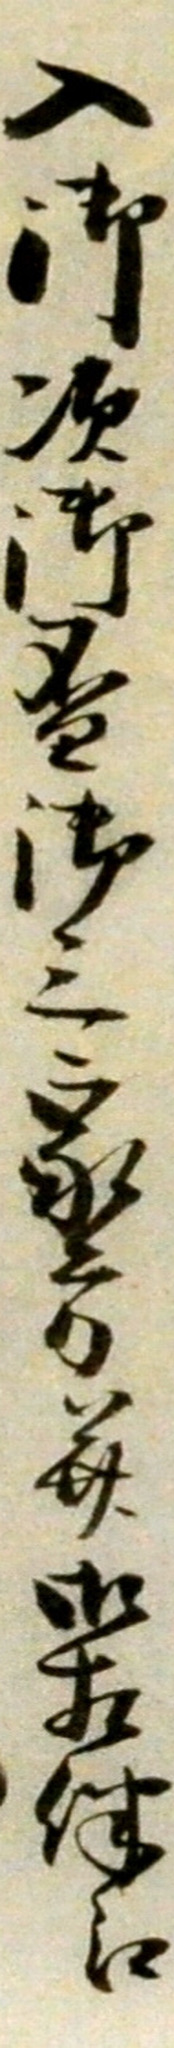入御次御盃御三家方并御相伴え
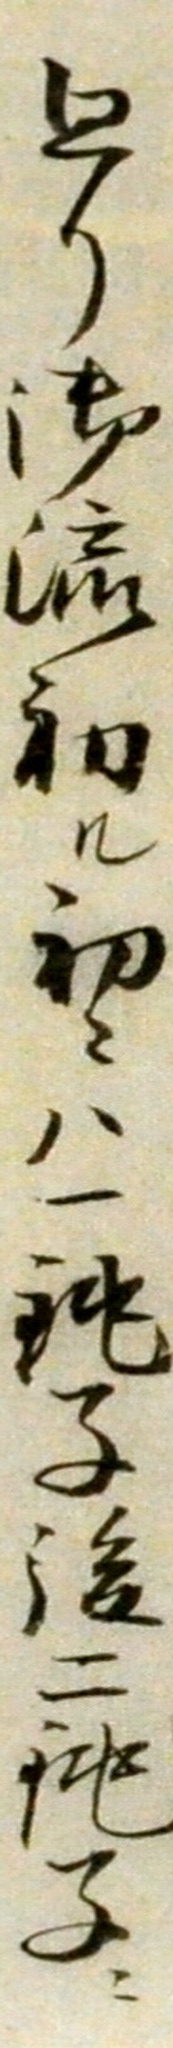廻り御流初ル初には一銚子後二銚子に
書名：申合帳〔一括〕
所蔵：伊那市立高遠町図書館・合同会社AMANE
